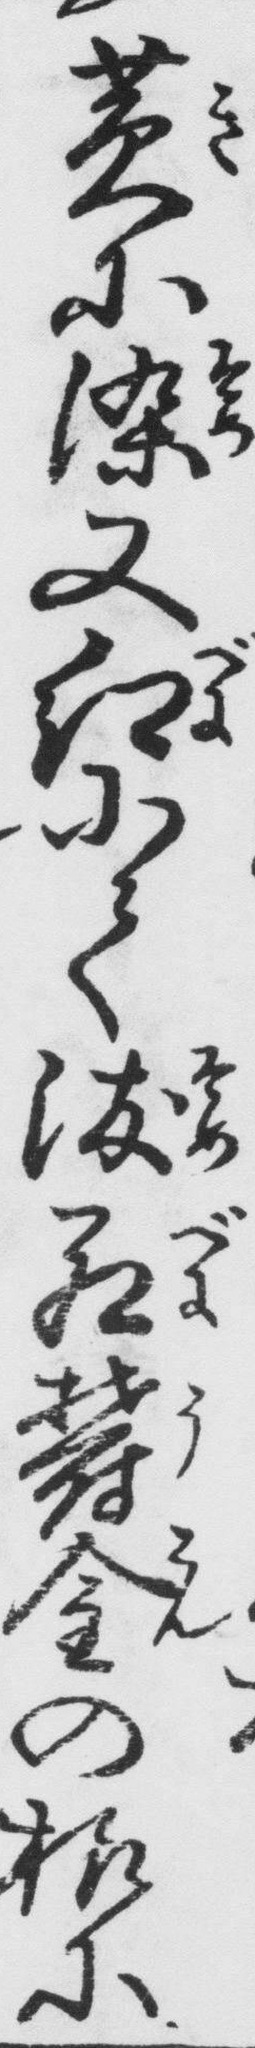黄に染又紅にて染紅鬱金の様に
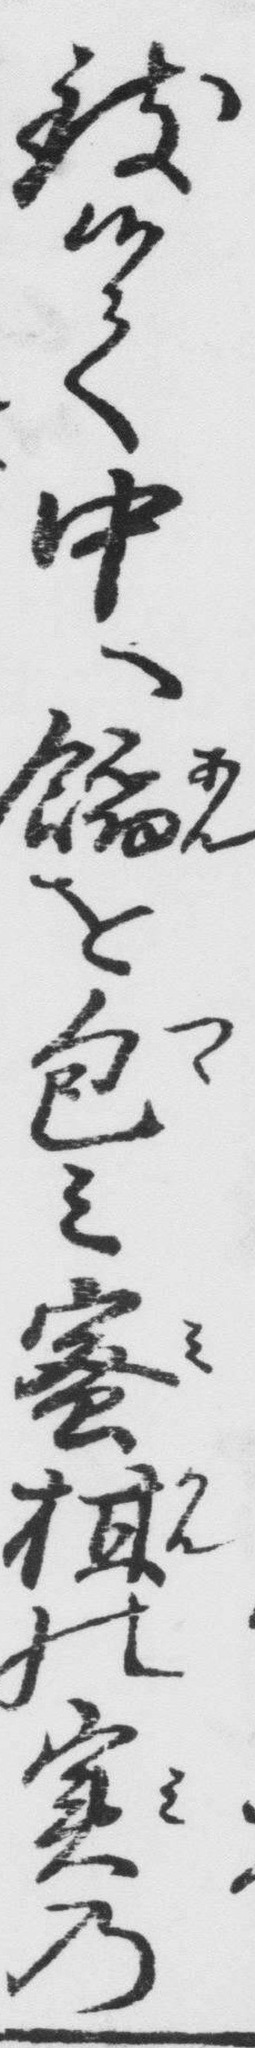致候て中へ餡を包み蜜柑の実の
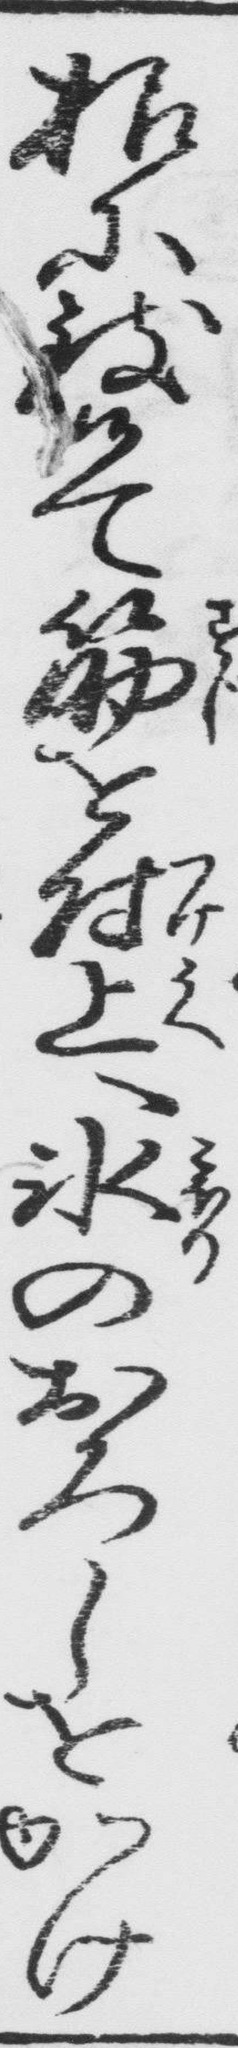様に致候て筋を付上へ氷のおろしをかけ
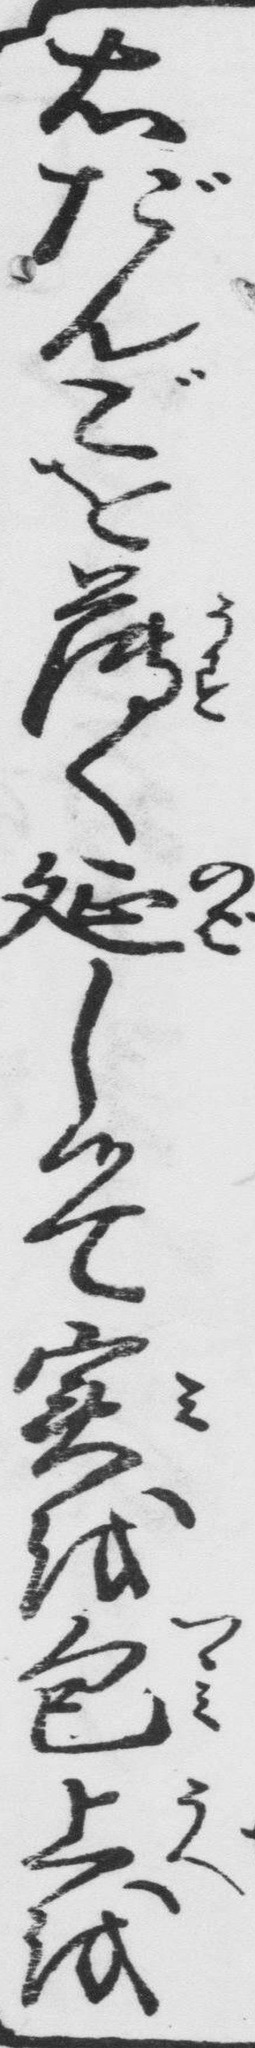右だんごを薄く延し候て実を包上を
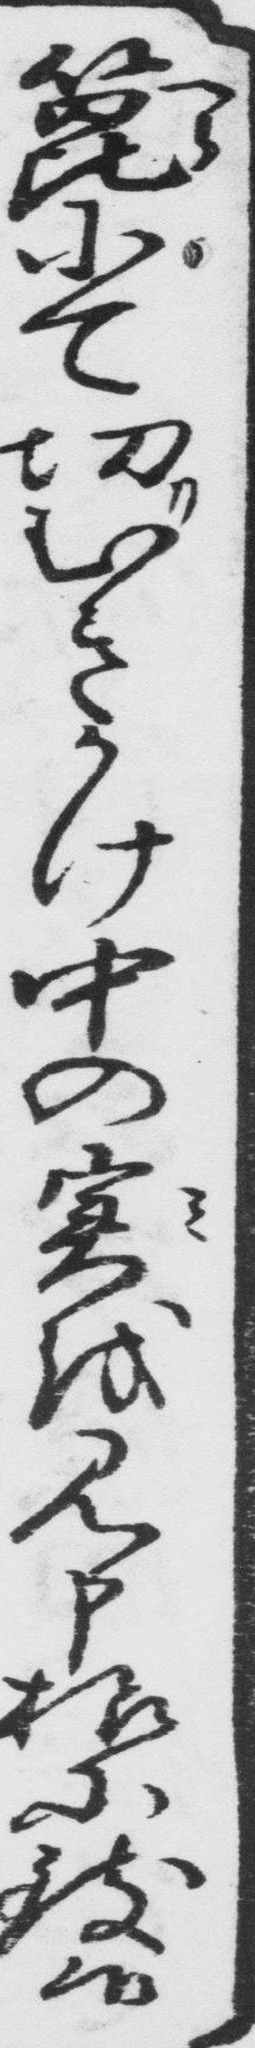箆にて切りむきかけ中の実を見申様に致候
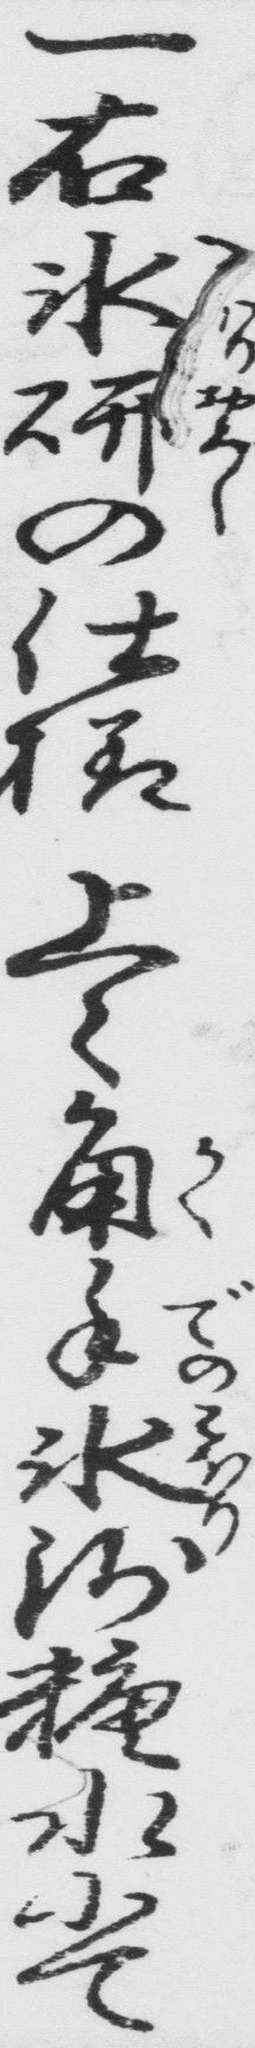一右氷研の仕様上々角手氷沙糖水にて
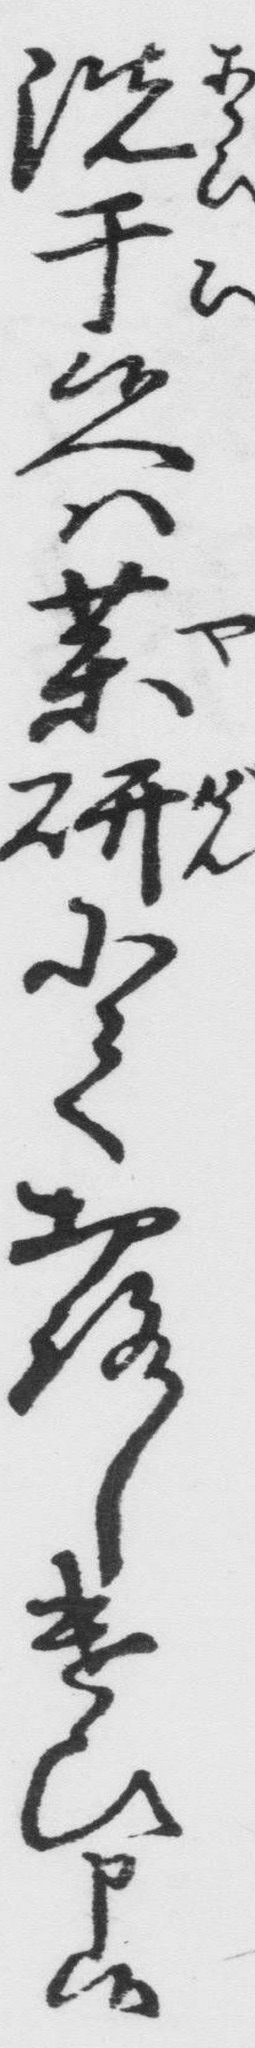洗干候へは薬研にておろし遣ひ申候
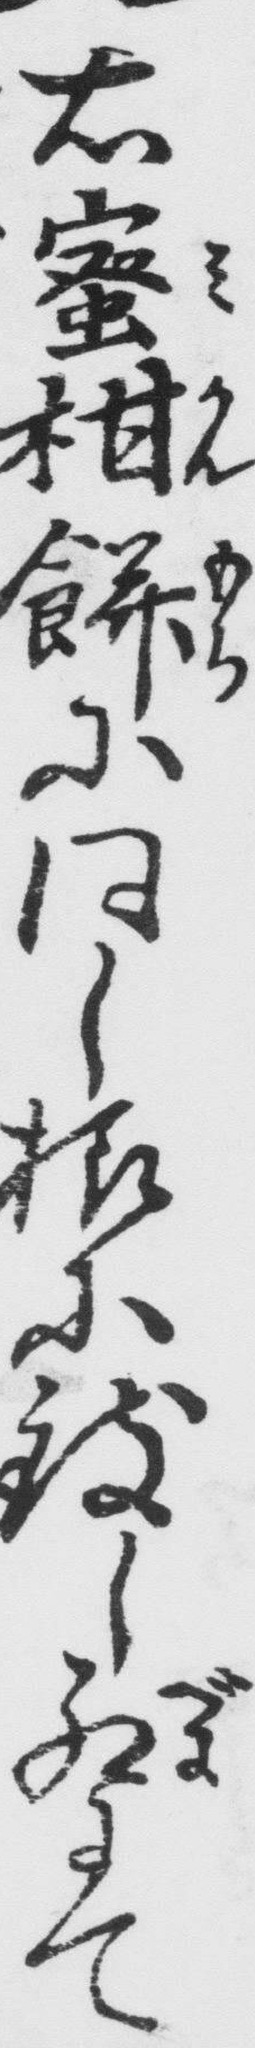右蜜柑餅に同し様に致し紅にて
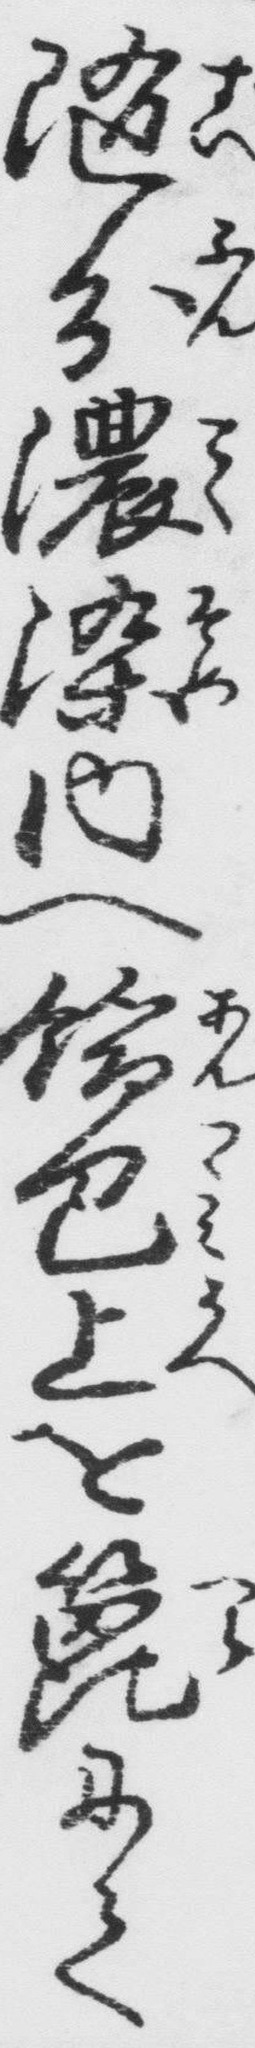随分濃染内へ餡包上を箆にて
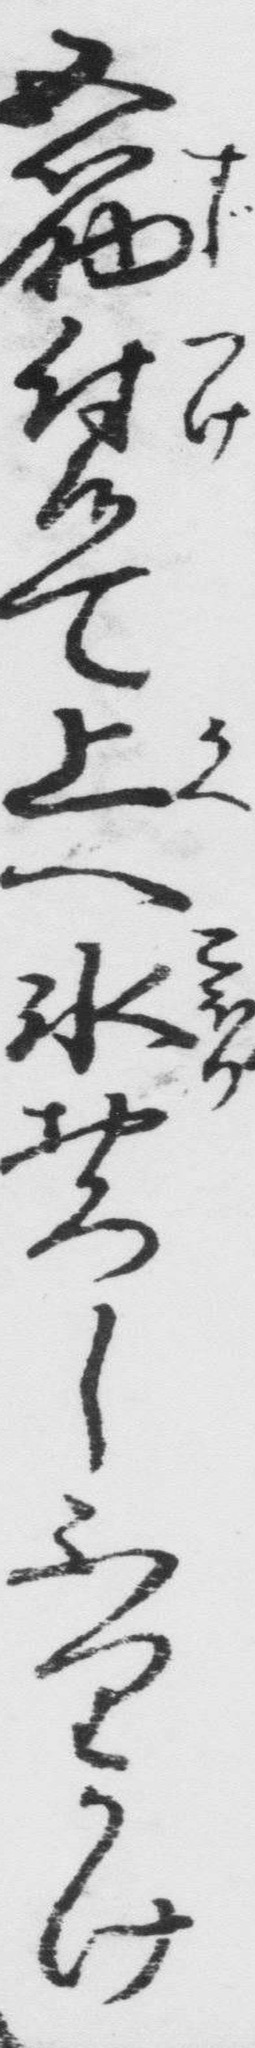五筋付候て上へ氷おろしふりかけ

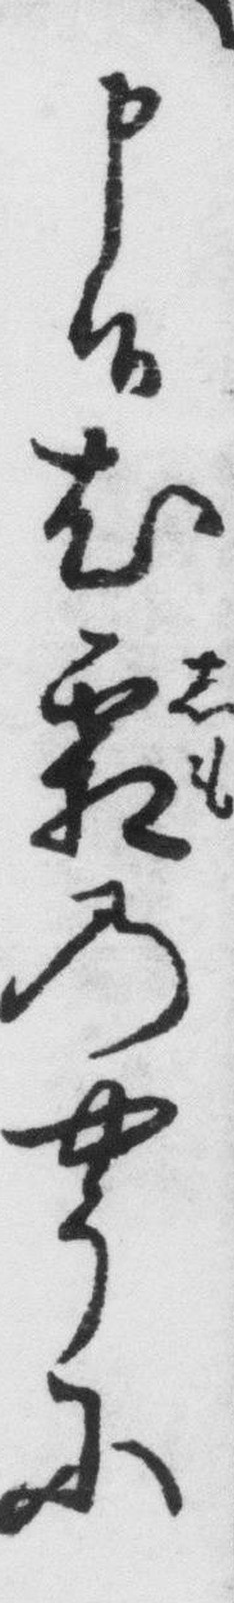申候尤霜のやうに
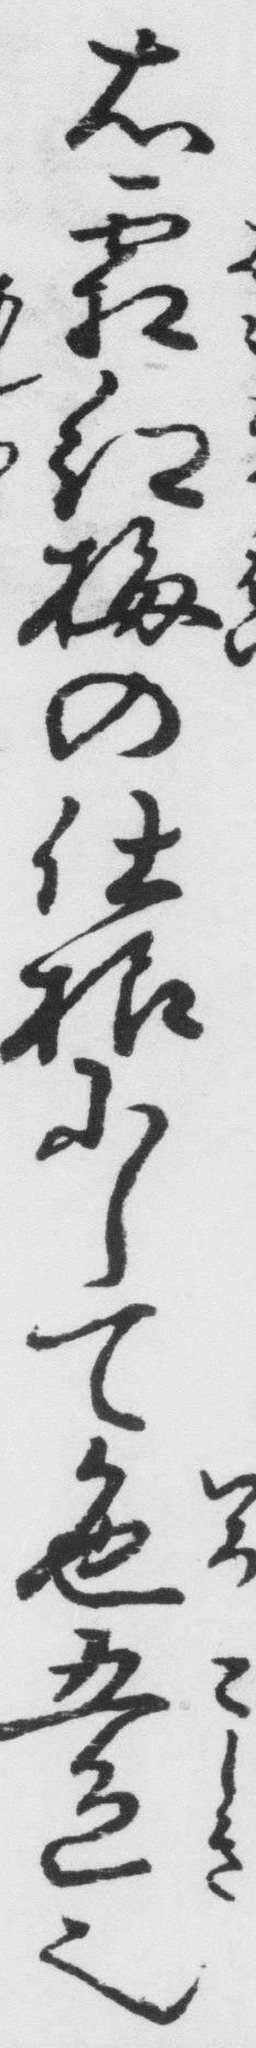右霜紅梅の仕様にして色五色也
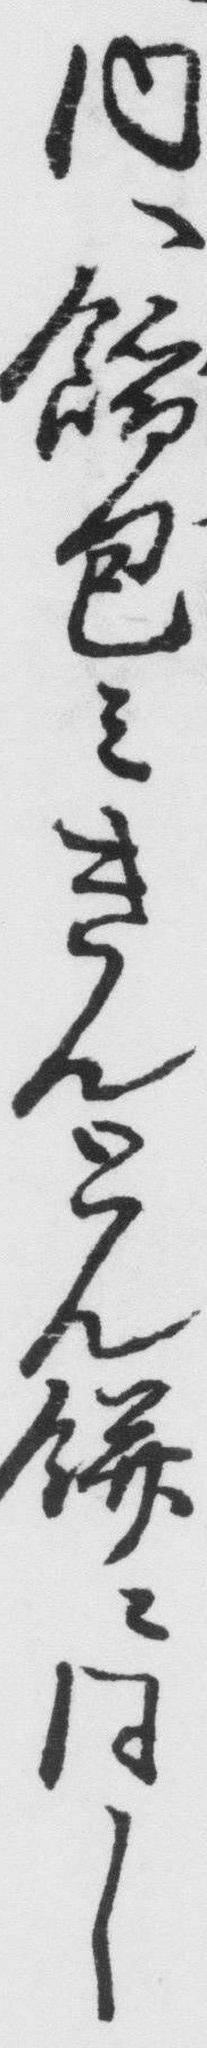内へ餡包みきんとん餅に同し
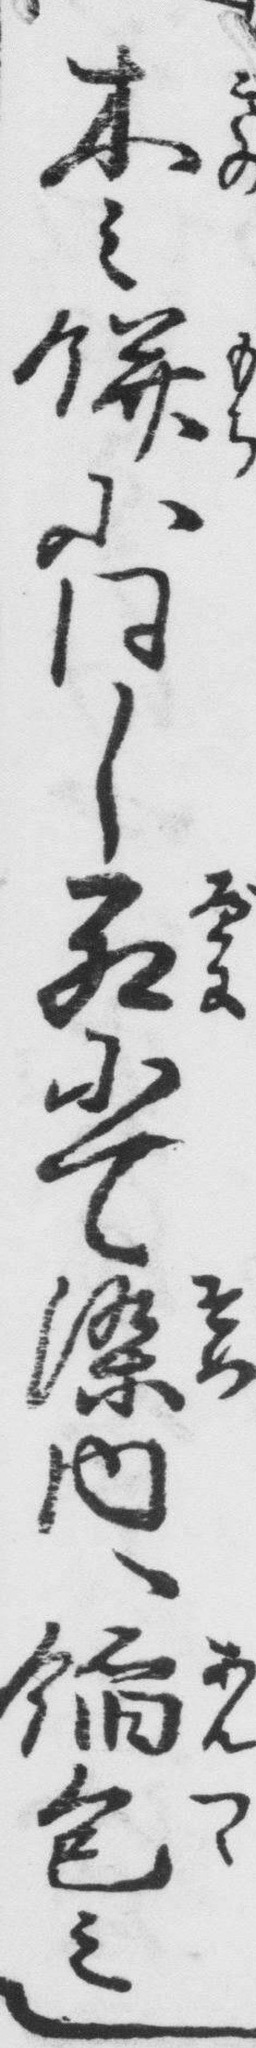木み餅に同し紅にて染内へ餡包み
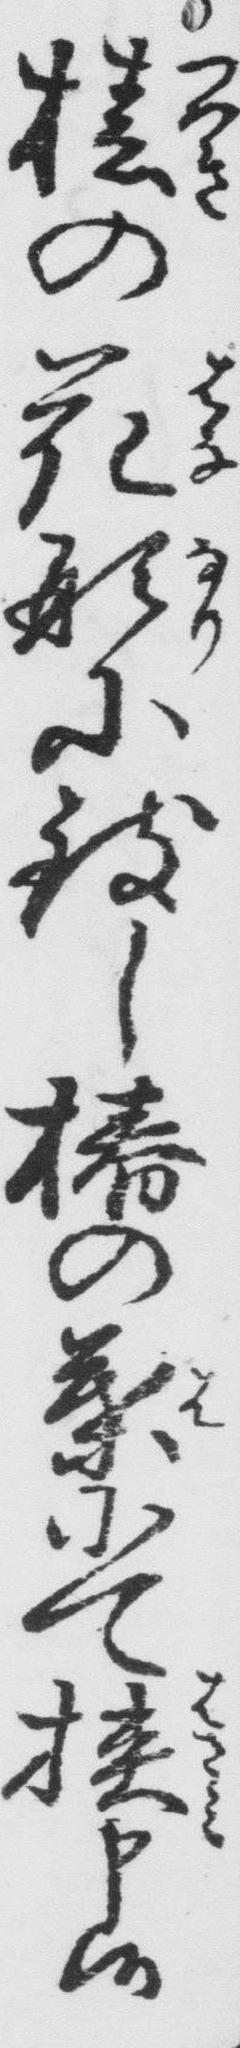椿の花形に致し椿の葉にて挟申候
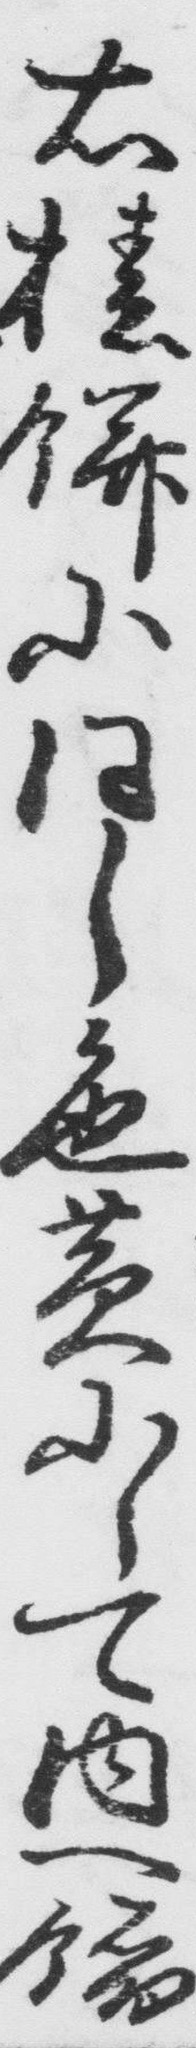右椿餅に同し色黄にして内へ餡
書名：御前菓子図式
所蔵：大阪府立大学学術情報センター 国文学研究資料館
